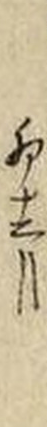卯十二月
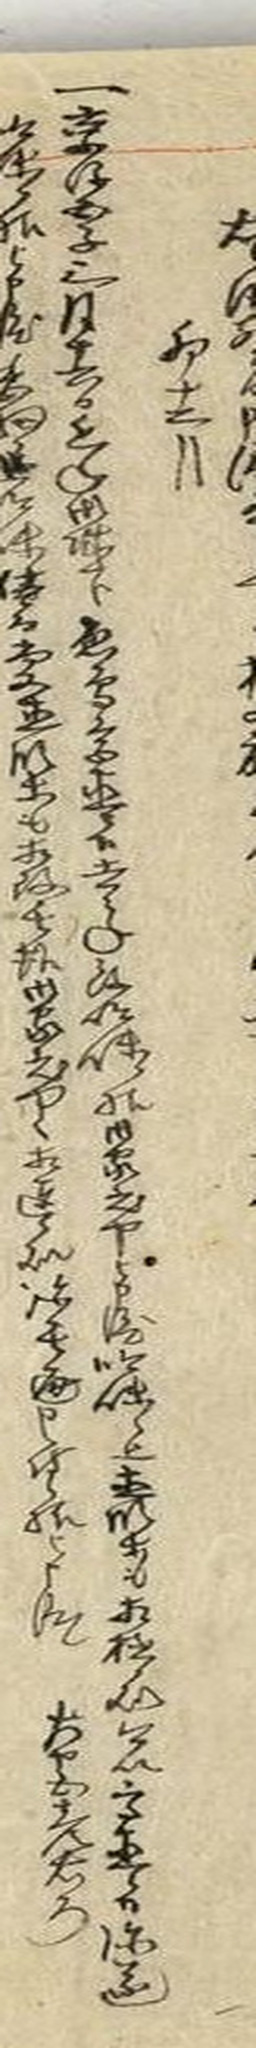吟味候様被申渡委細遂吟味依て尚又直段等も相改其趣御家老中へ相達候処弥其通申付候様被申渡候大宮彦右衛門
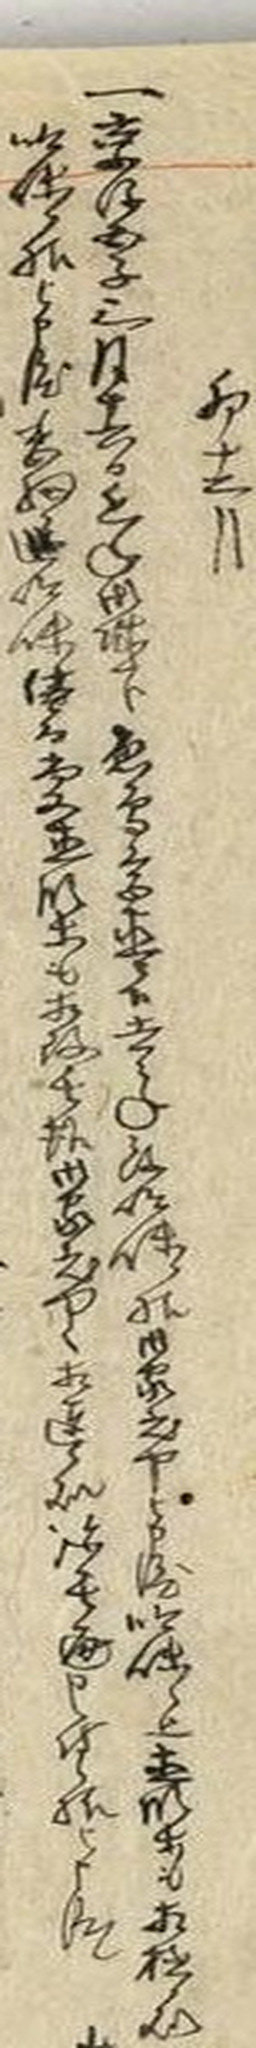吟味候様被申渡委細遂吟味依て尚又直段等も相改其趣御家老中へ相達候処弥其通申付候様被申渡候大宮彦右衛門
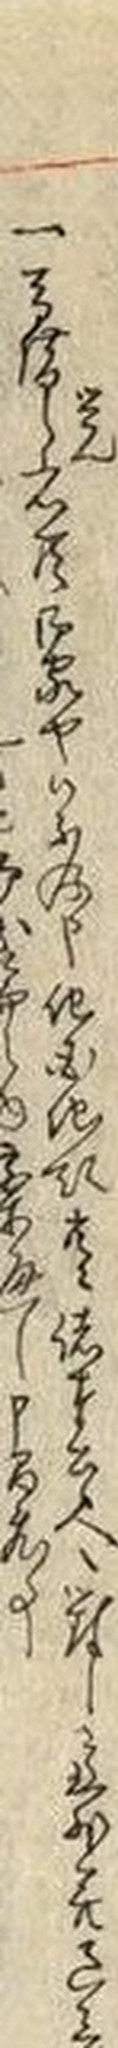一馬借之者共御家中は不及申他国他領共に諸奉公人へ対し慮外并過言申間敷事
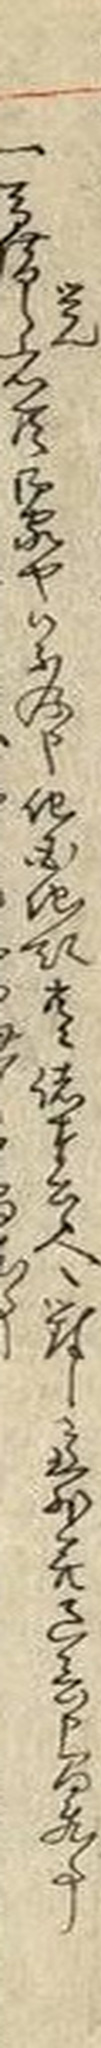一馬借之者共御家中は不及申他国他領共に諸奉公人へ対し慮外并過言申間敷事
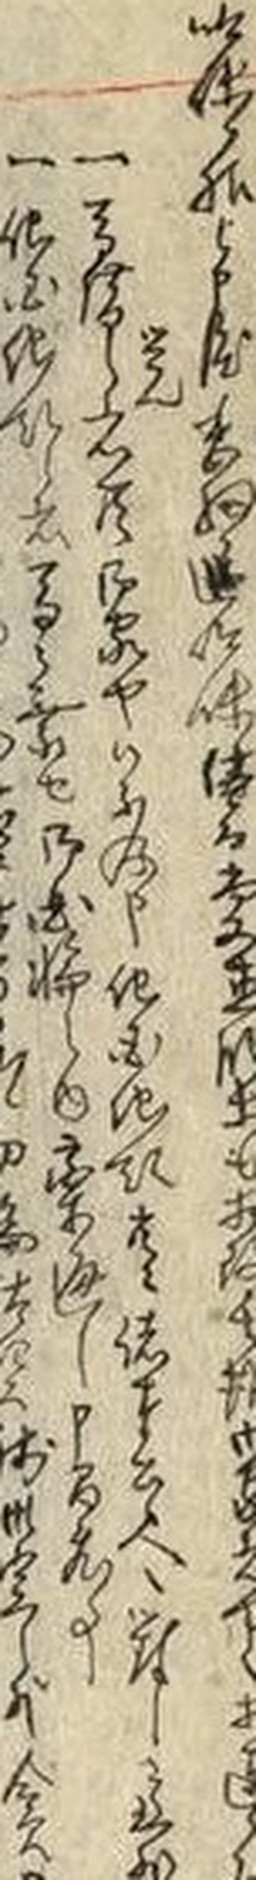一他国他領之者馬に乗セ御曲輪之内牽通し申間敷事
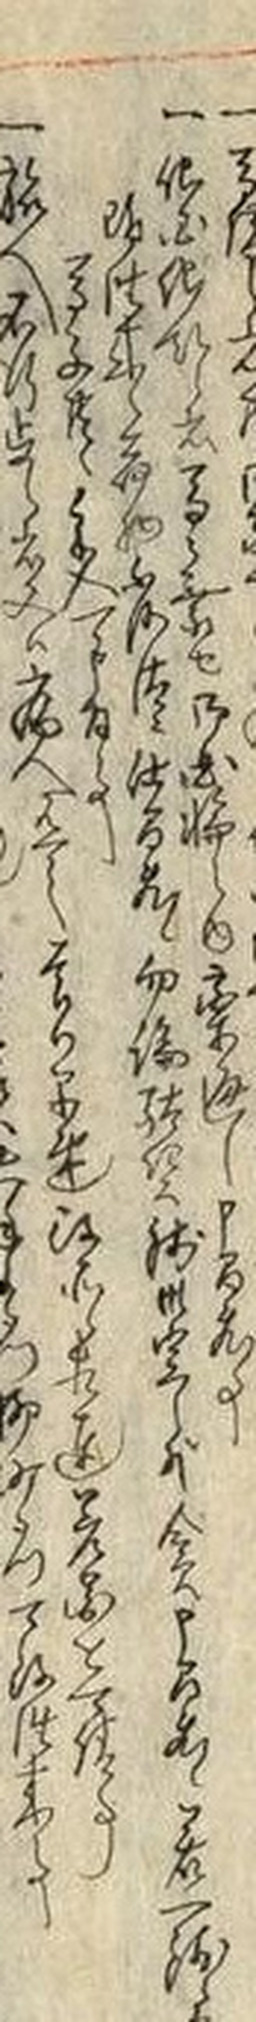一旅人不行歩候者又は病人有之節は早速役所へ相達差図を可請事
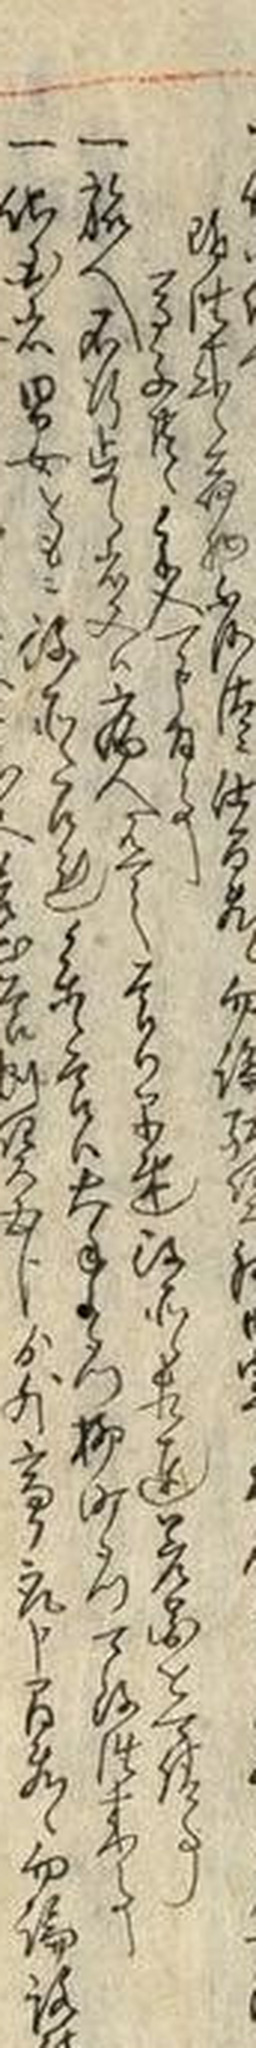一他国者男女共に役所へ召連参候節は大手御門柳町御門可致往来事
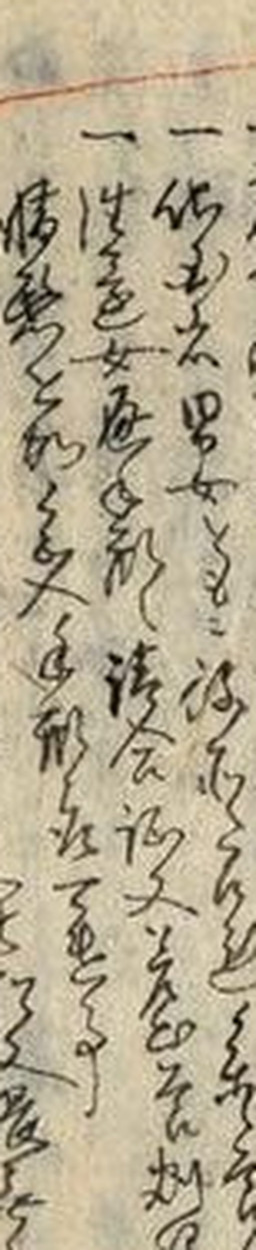憐愍を加念入手形取可遣事
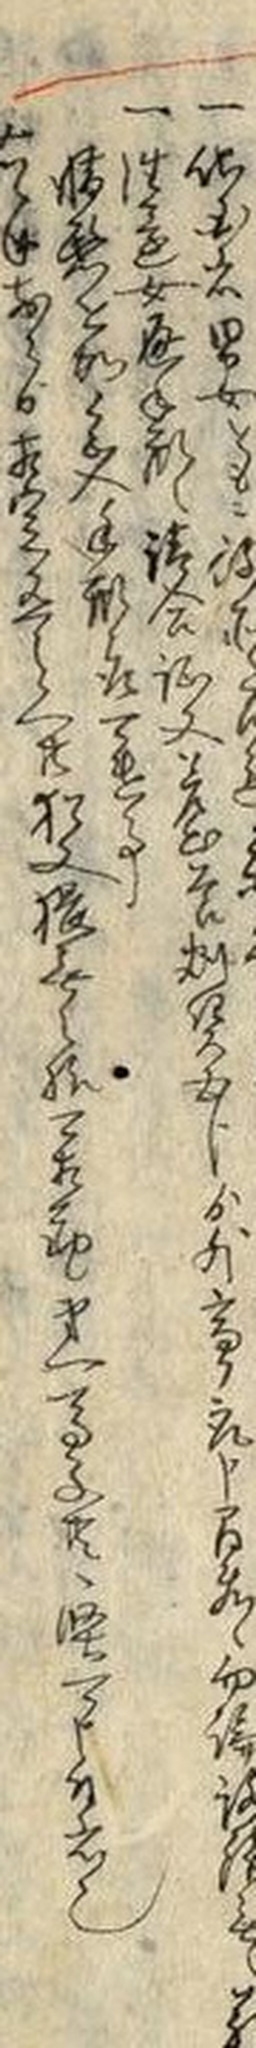右之趣前々ゟ相定有之候へ共猶又猥無之様可相勤候第一馬子共へ堅可申付者也
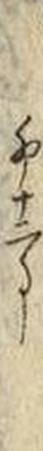卯十二月

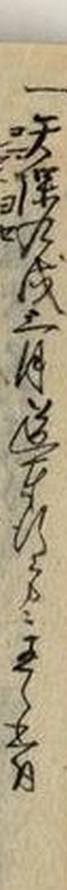一天保九戌三月道奉行方に有之書付
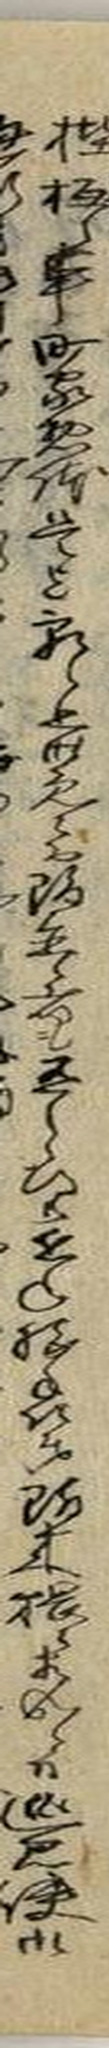梐枑之事町家惣体是迄願之上御免にて附置候者も有之候得共近年勝手次第附来猥に相成候に付巡見使御
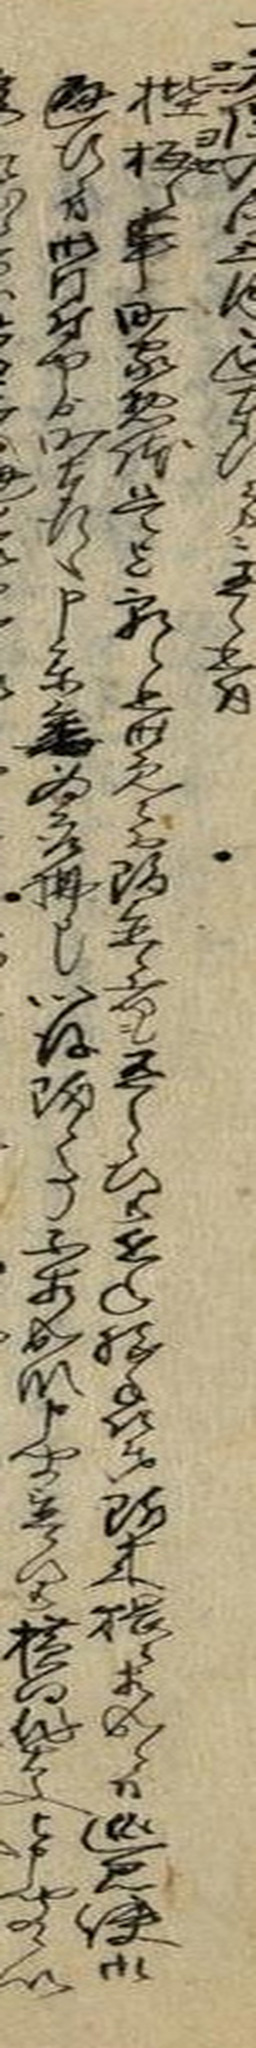通行に付御目付中ゟ町奉行江申参悉為取払申候以後附候事不相成段申聞置候得共横田作大夫被申聞候以
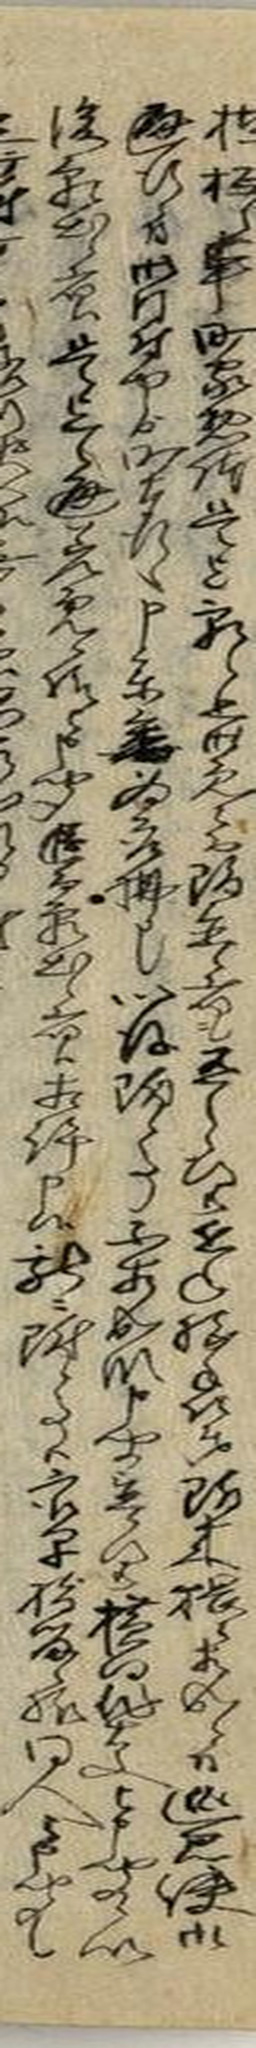後願出候者は是迄之通差免候様被申聞追て願出候者は相許申候新に附候事は最早指留候様同人被申聞候
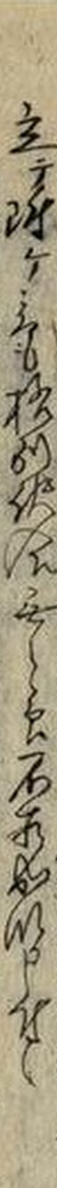立テ附ケにても格別訳合無之候ては不相成段申付候
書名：御城下諸事之部
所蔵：福井県文書館 Fukui Prefectural Archives
